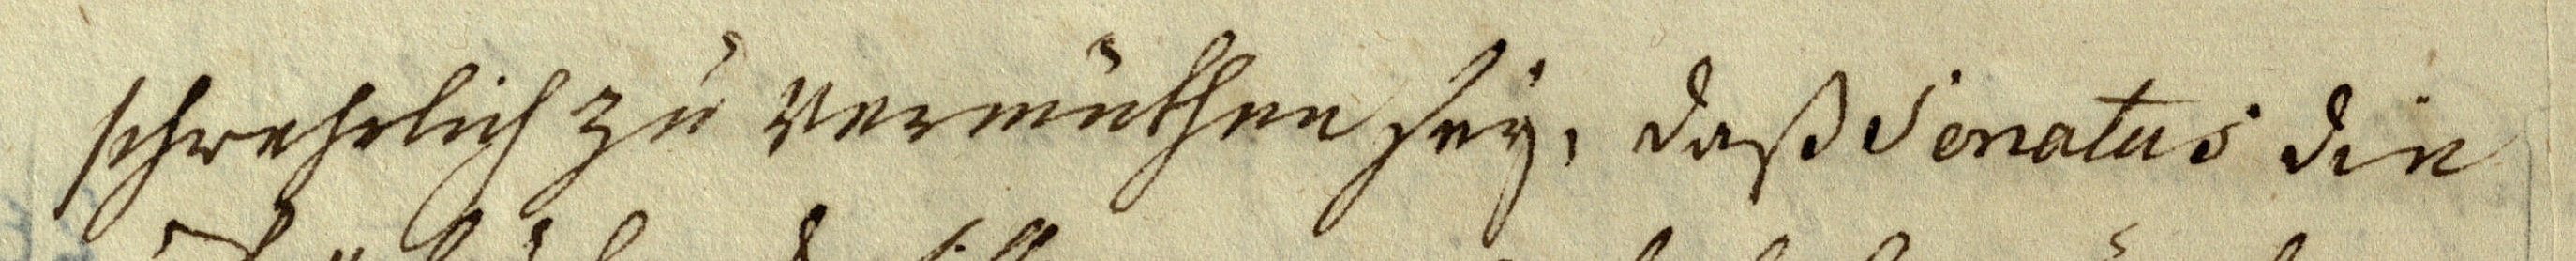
schwehrlich zu vermuthen seÿ, daß Senatus die
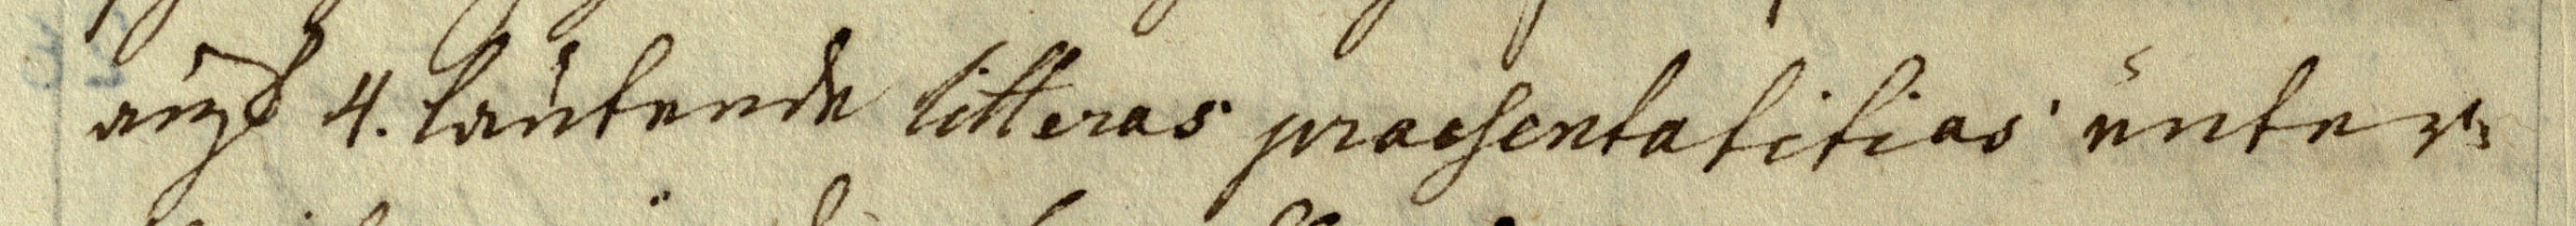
auf 4. lautende litteras praesentatitias unter¬
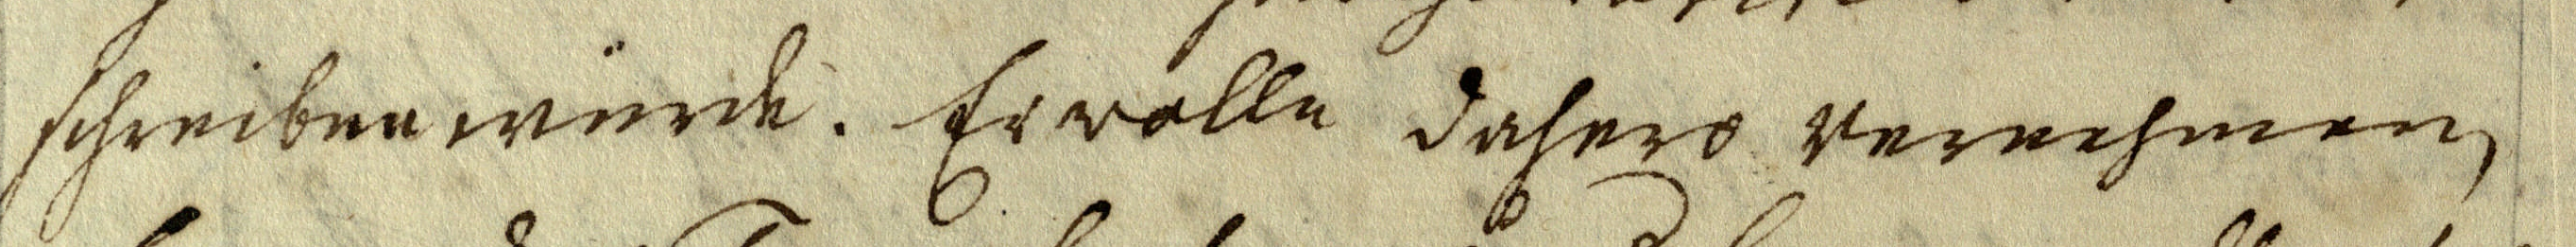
schreiben würde. Er wolle dahero vernehmen,
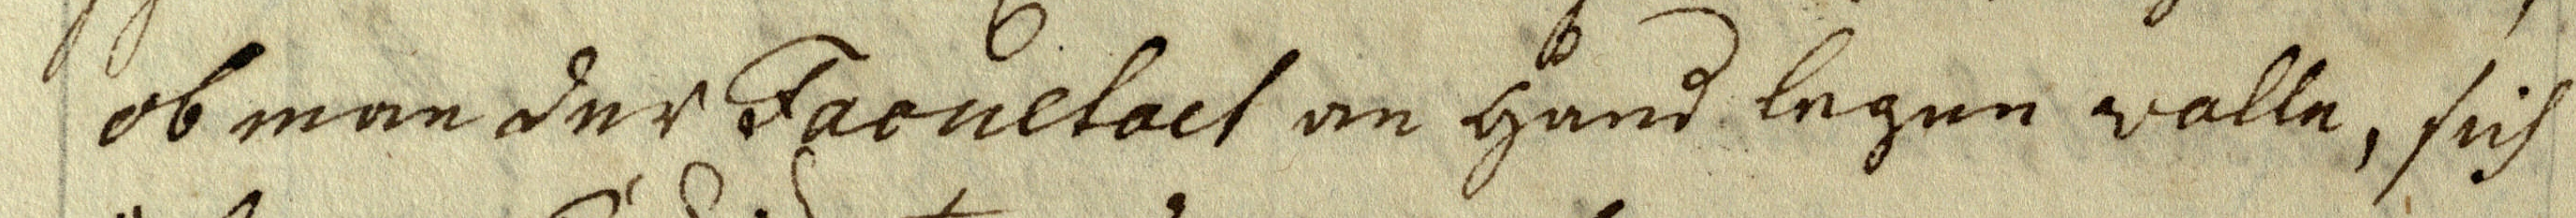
ob man der Facultaet an Hand legen wolle, sich
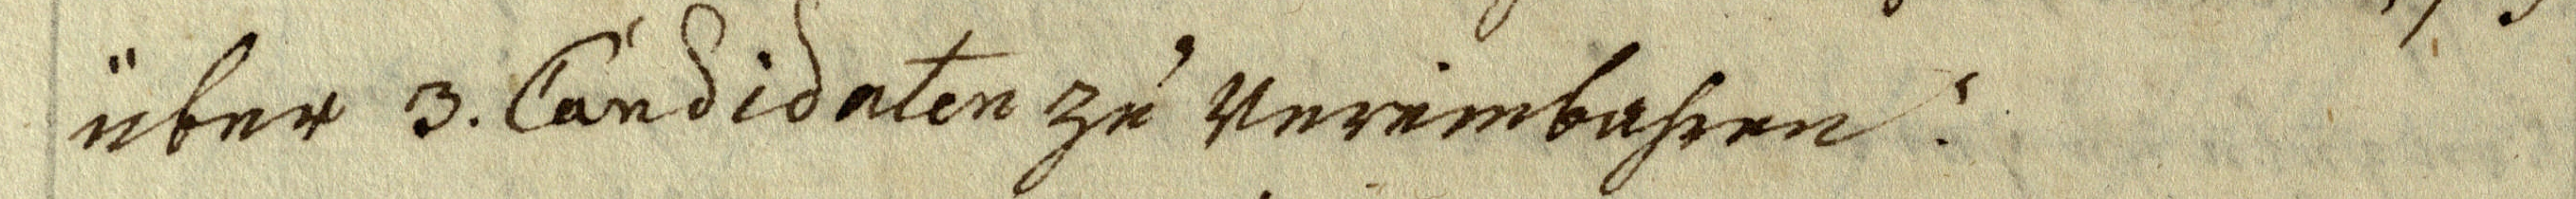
über 3. Candidaten zu vereinbahren?
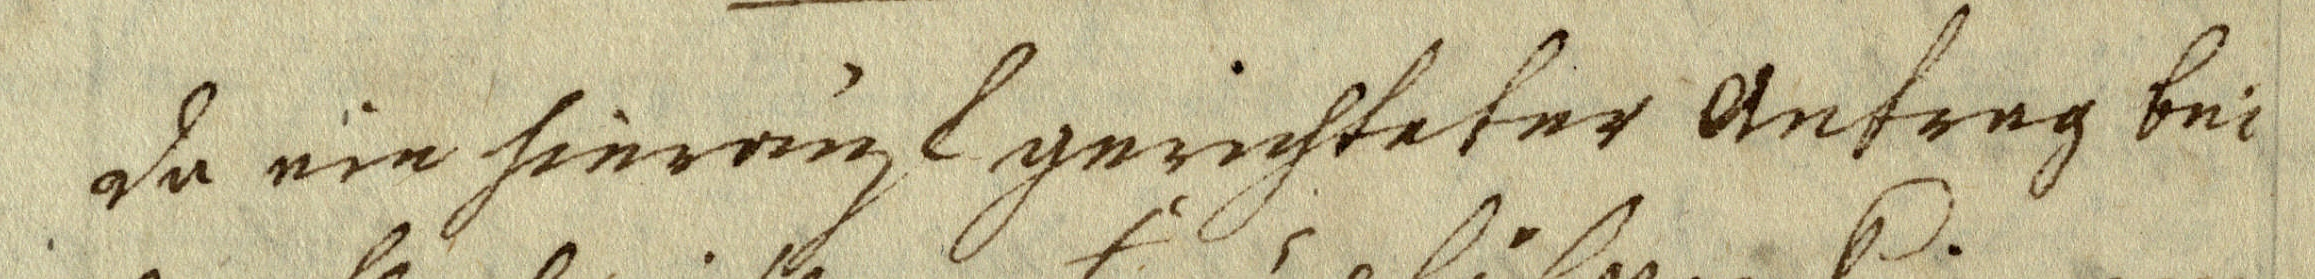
Da ein hierauf gerichteter Antrag bei
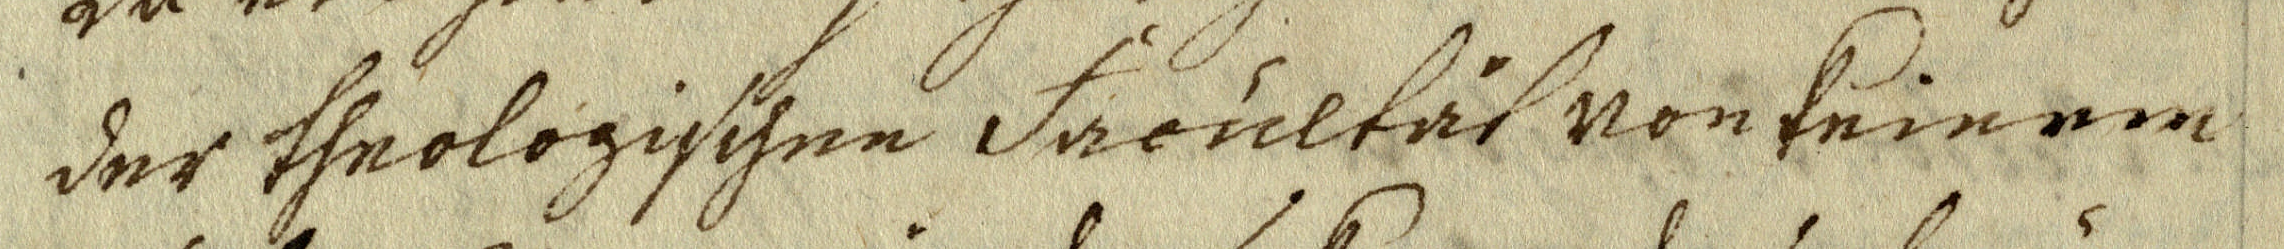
der theologischen Facultät von keinem
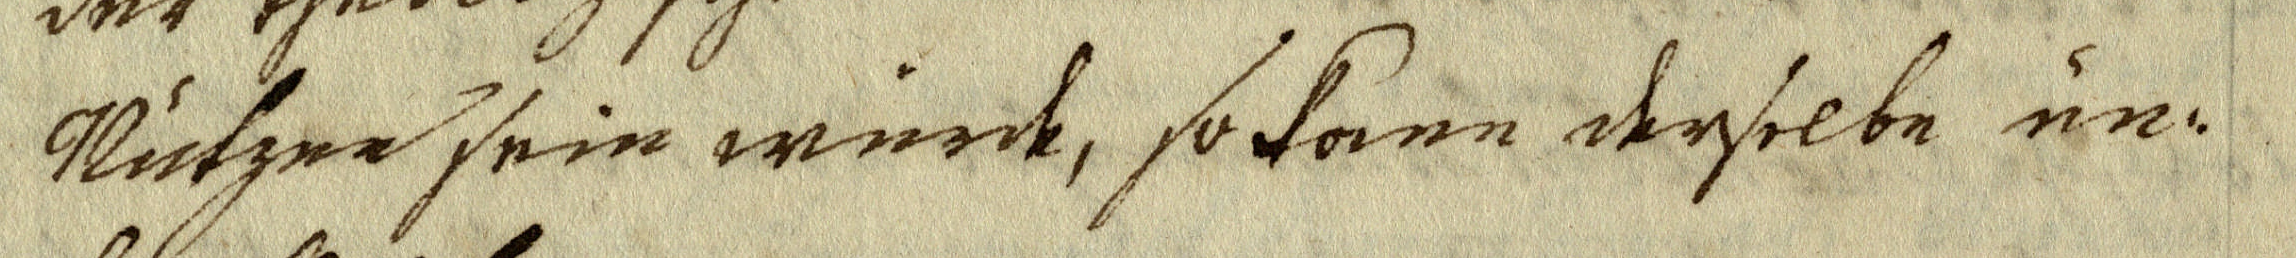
Nutzen sein würde, so kann derselbe un¬
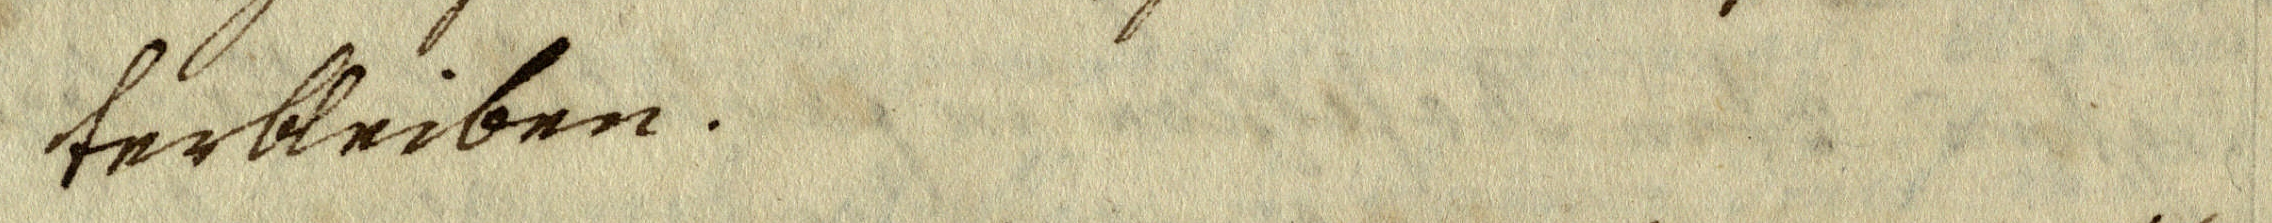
terbleiben.
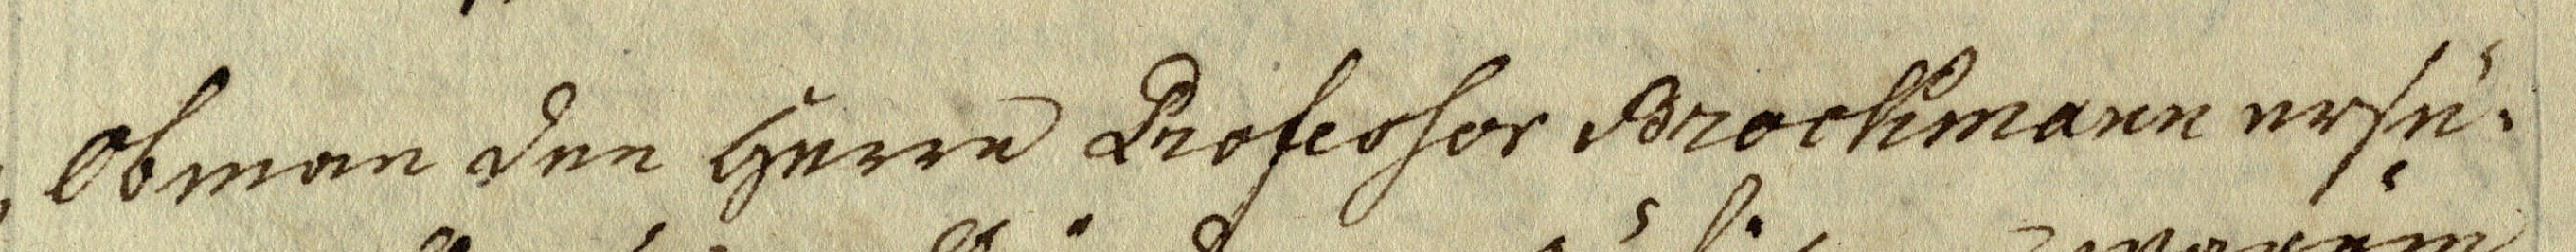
3, Ob man den Herrn Professor Brockmann ersu¬
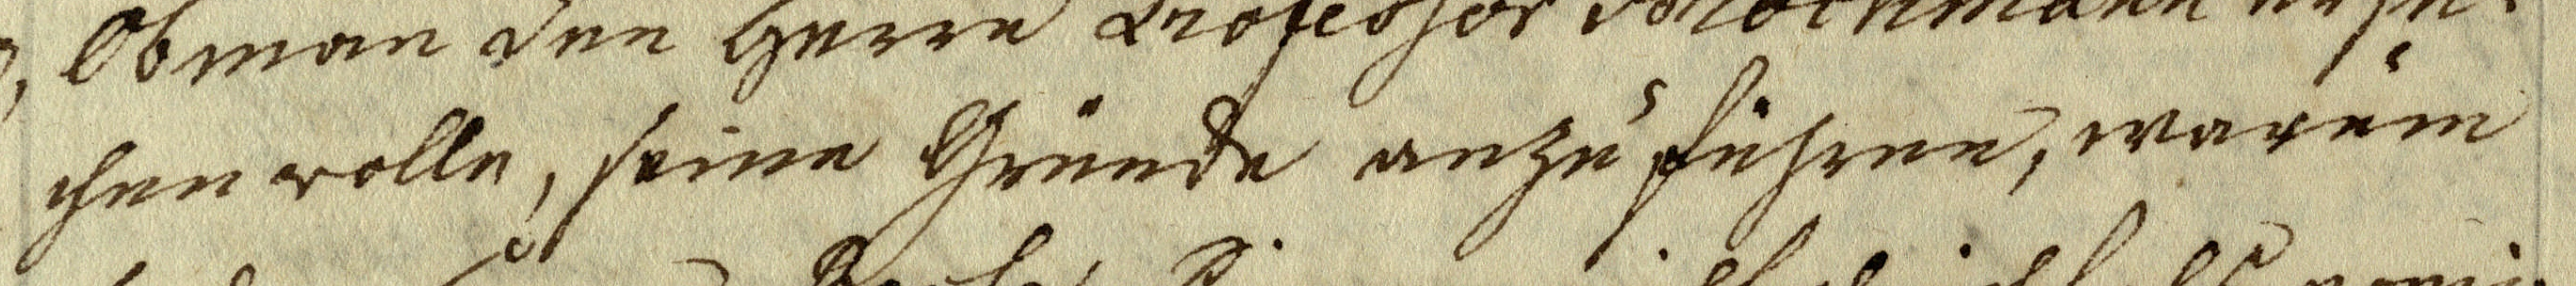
chen wolle, seine Gründe anzuführen, warum
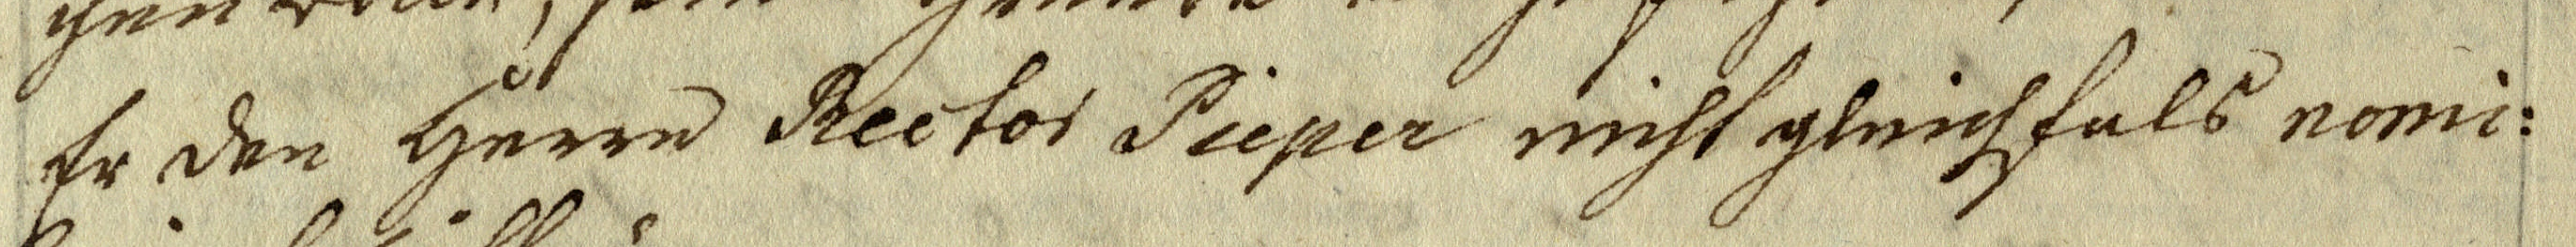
Er den Herrn Rector Pieper nicht gleichfals nomi¬
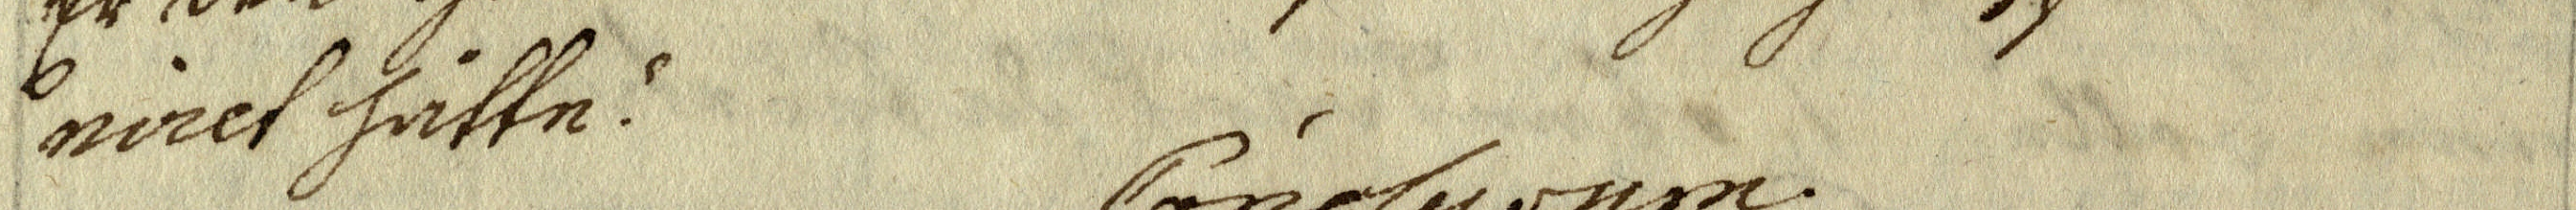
niret hätte?
